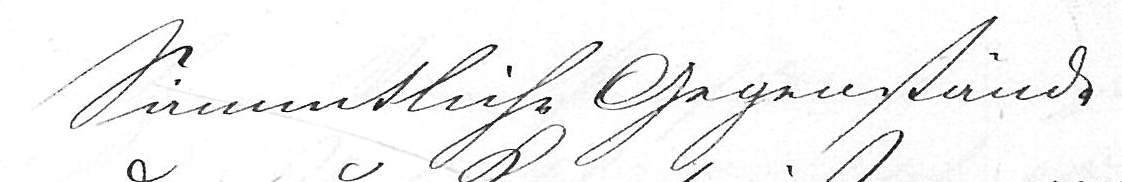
Sämmtliche Gegenstände
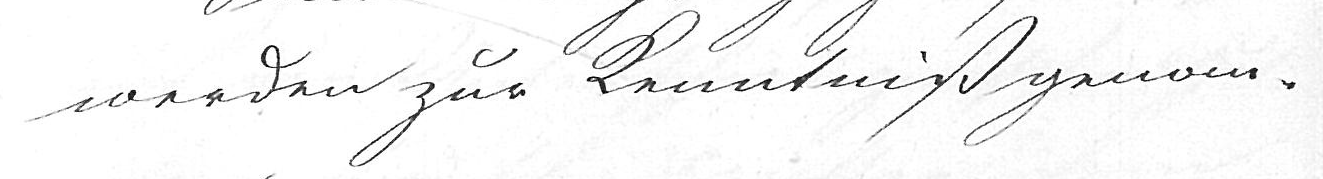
werden zur Kenntniß genom-
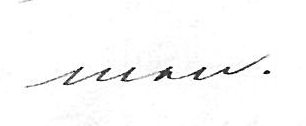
men.
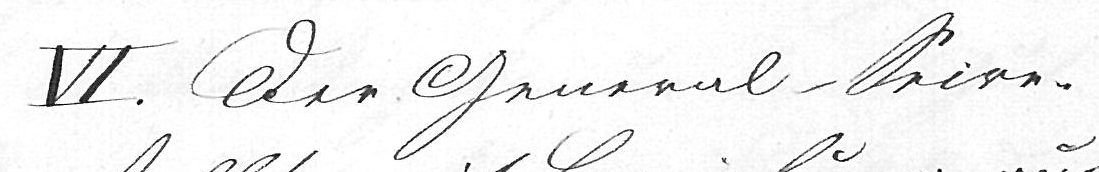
VI. Der General-Secre-
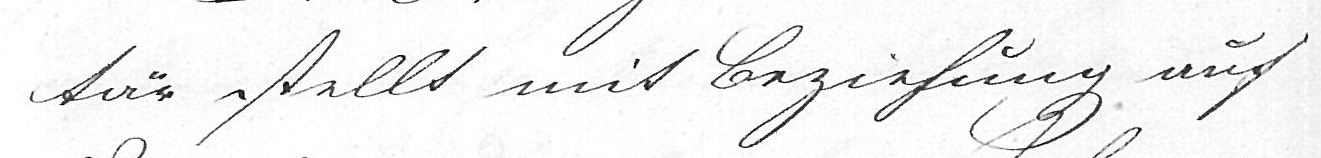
tär stellt mit Beziehung auf
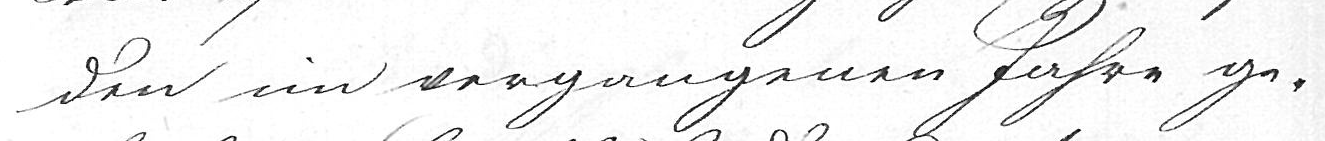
den im vergangenen Jahre ge-
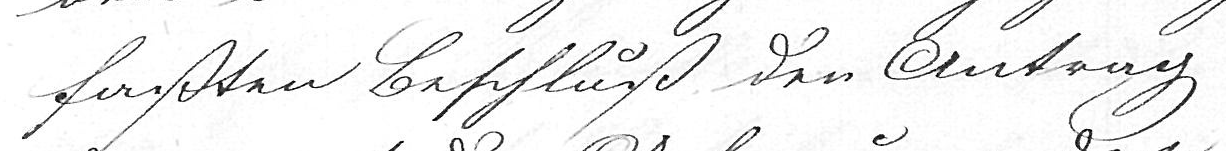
faßten Beschluß den Antrag
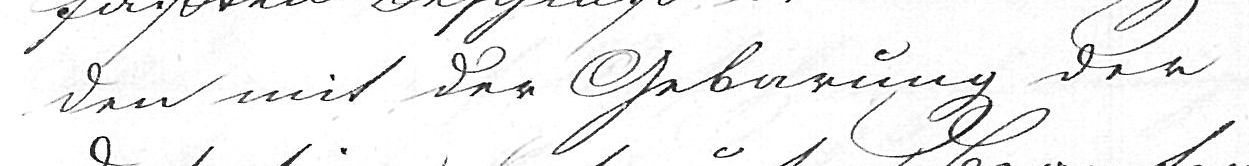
den mit der Gebarung der
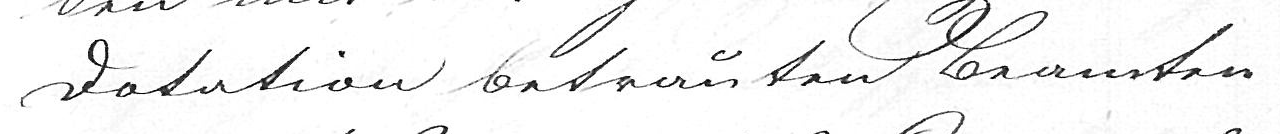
Dotation betrauten Beamten
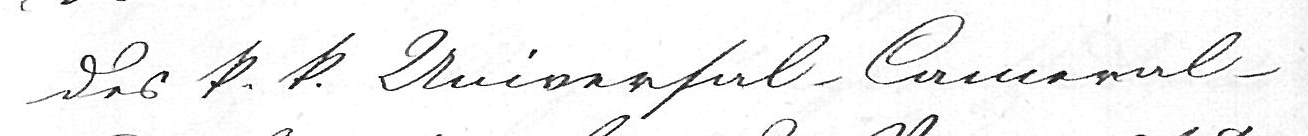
der k. k. Universal-Cameral-
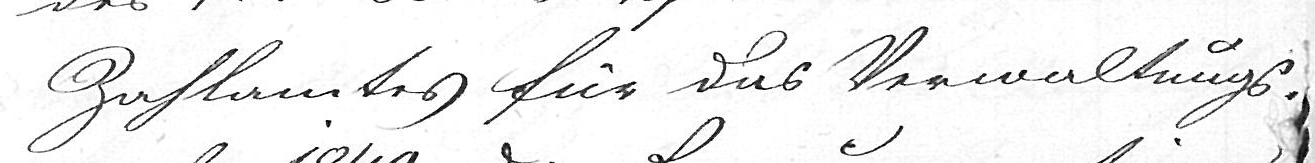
Zahlamtes für das Verwaltungs-
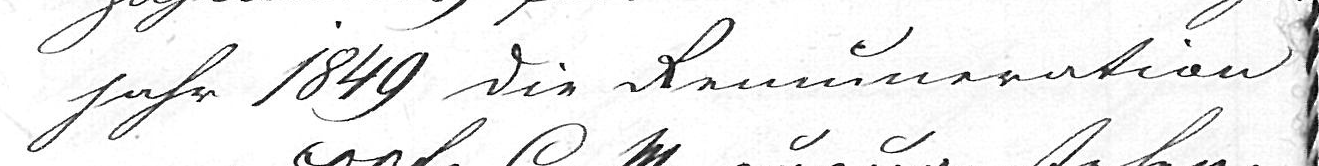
jahr 1849 die Remuneration
